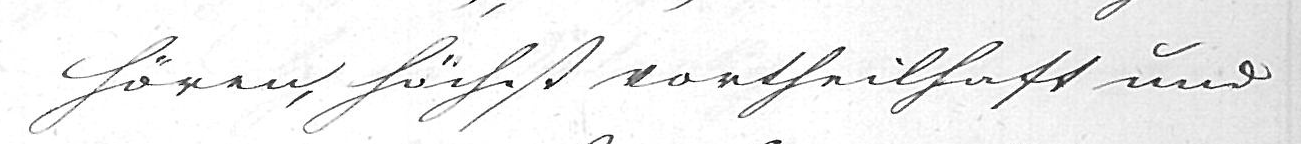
hören, höchst vortheilhaft und
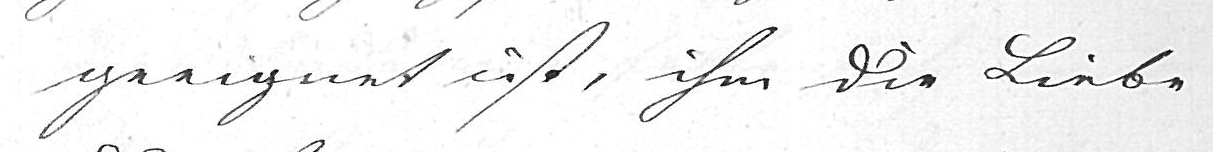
geeignet ist, ihm die Liebe
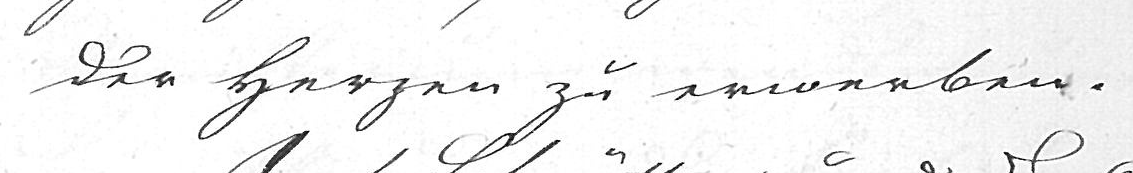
der Herzen zu erwerben.
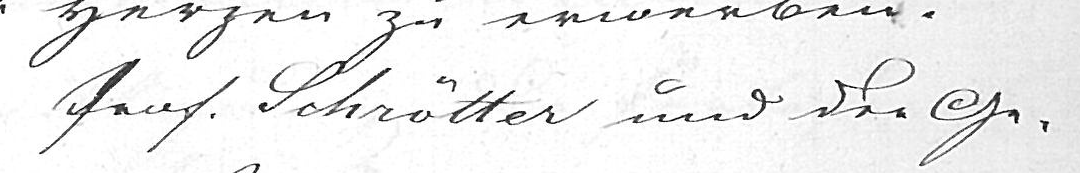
Prof. Schrötter und der Ge-
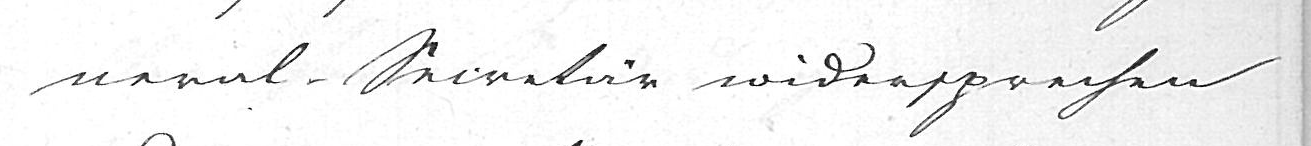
neral-Secretär widersprechen
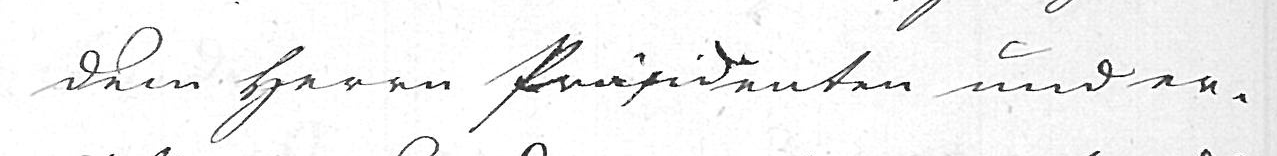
dem Herren Präsidenten und er-
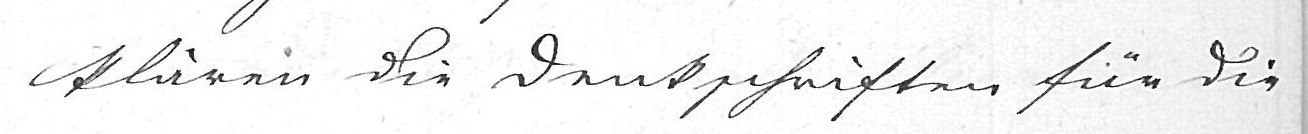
erklären die Denkschriften für die
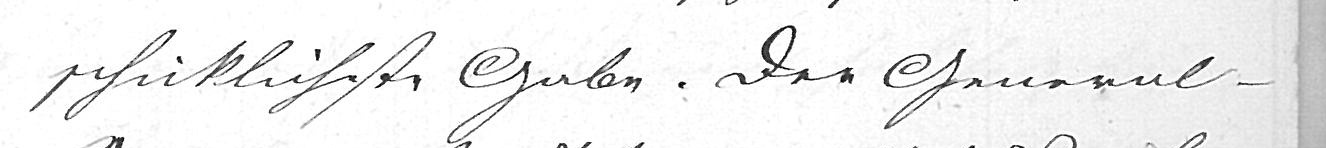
schicklichste Gabe. Der General-
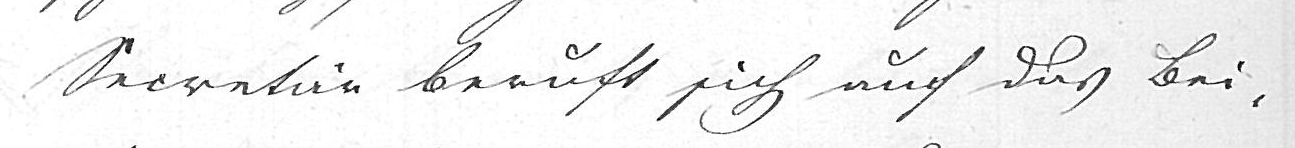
Secretär beruft sich auf das Bei-
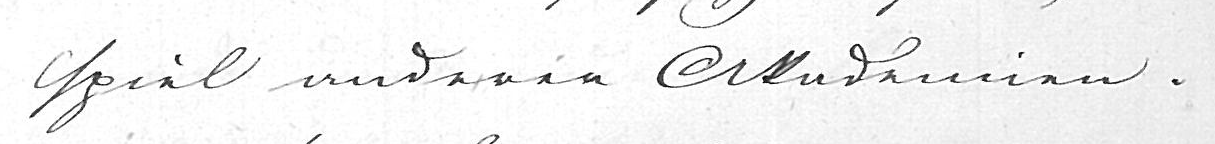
spiel anderen Akademien.
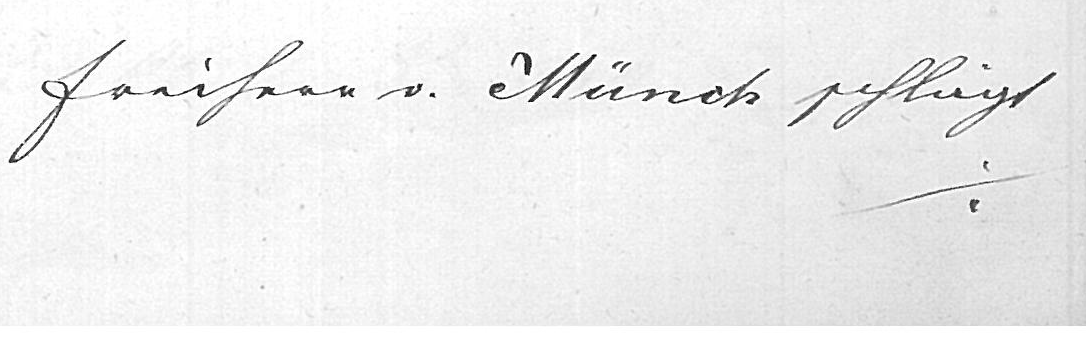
Freiherr v. Münch schlägt
